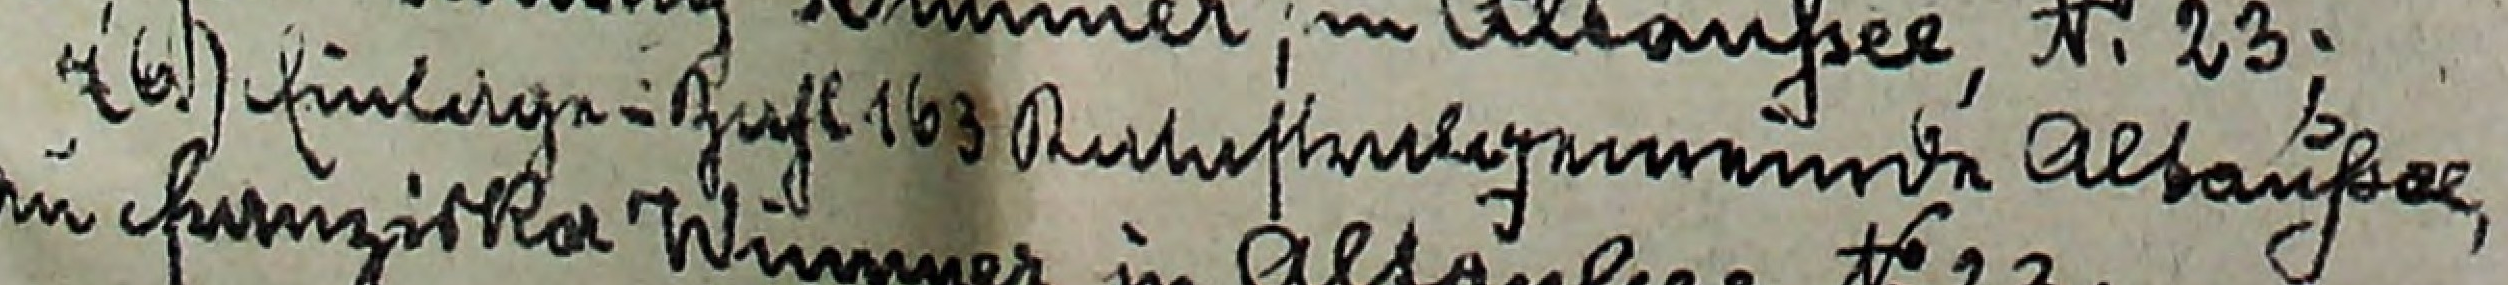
76.) Einlage - Zahl 163 Katastralgemeinde Altaussee,
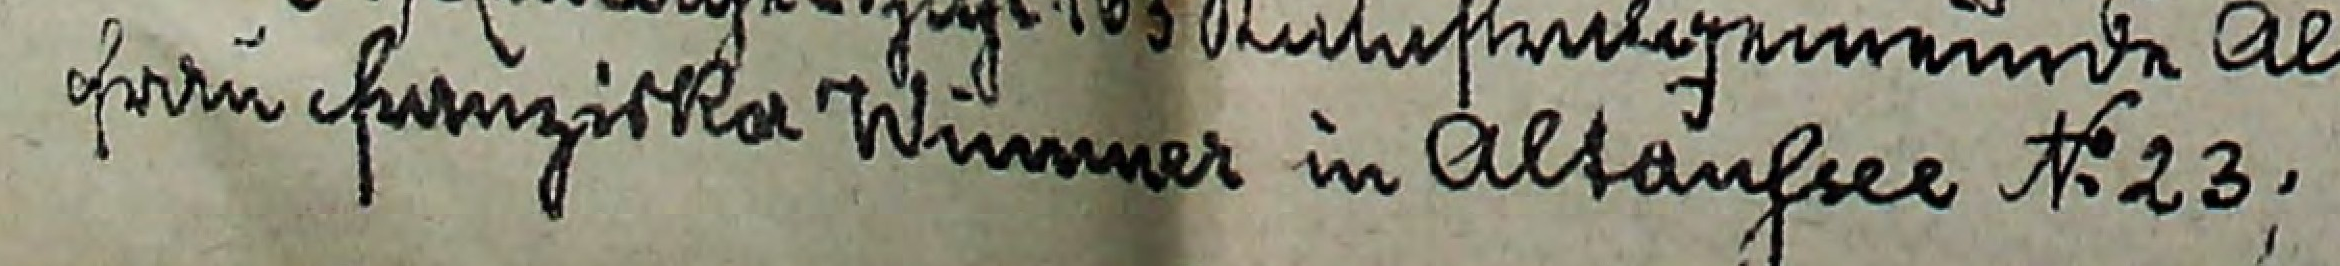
Frau Franziska Wimmer in Altaussee № 23;
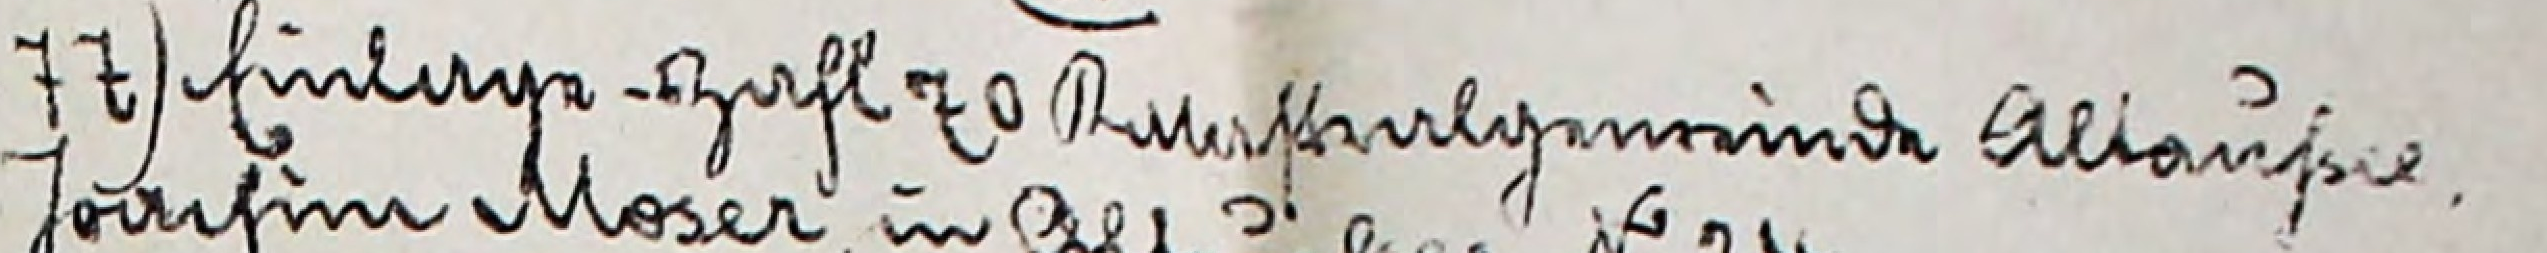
77) Einlage - Zahl 70 Katastralgemeinde Altaussee,
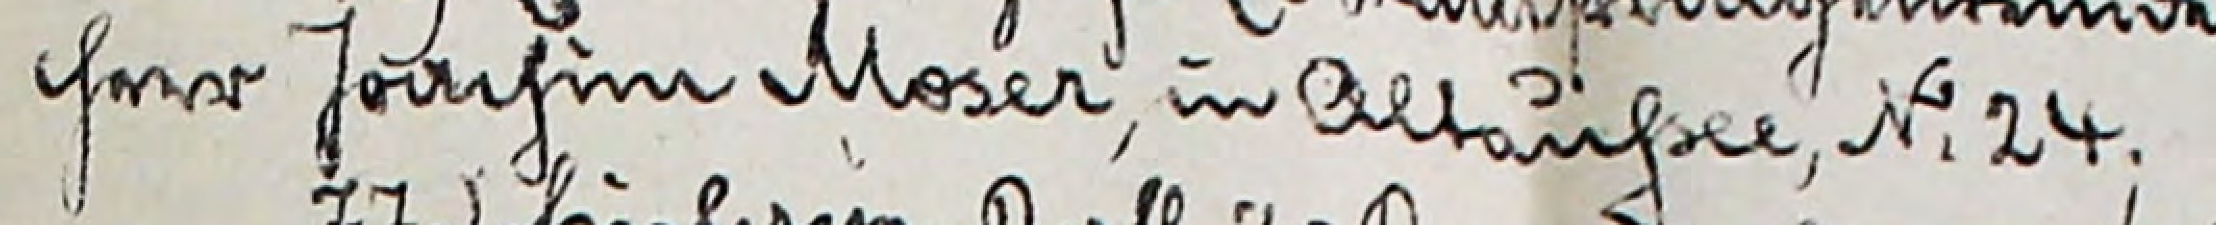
Herr Joachim Moser, in Altaussee, № 24;
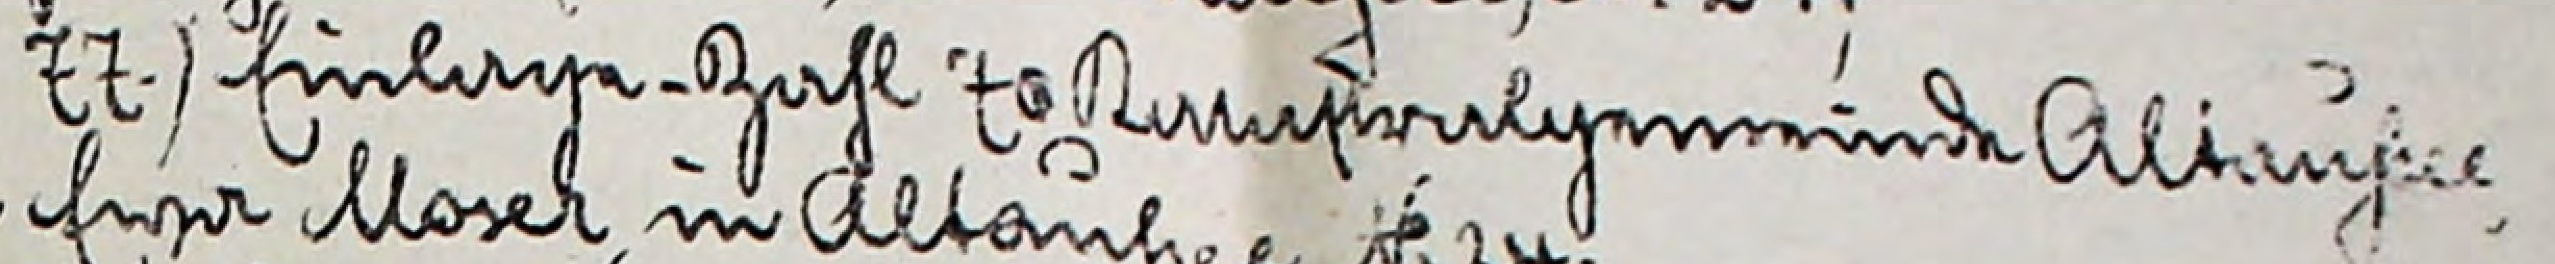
77.) Einlage - Zahl 70 Katastralgemeinde Altaussee,
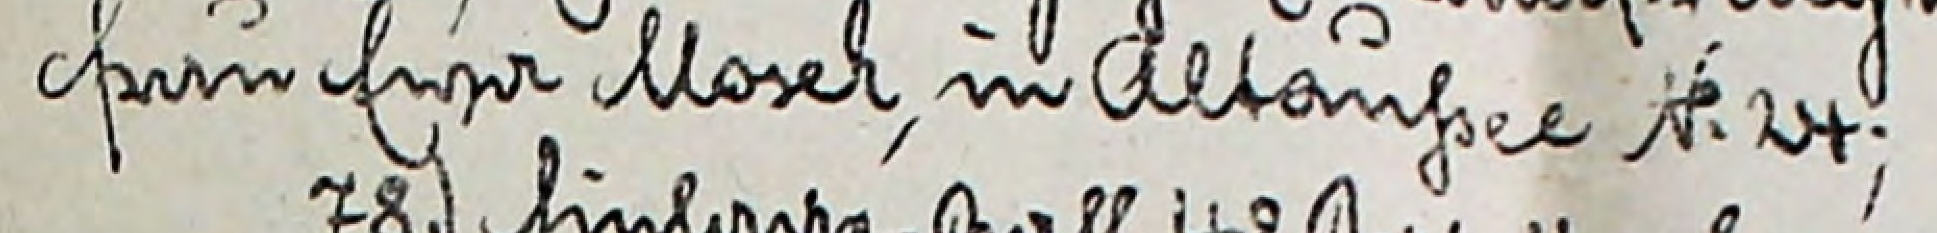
Frau Eva Moser, in Altaussee № 24;
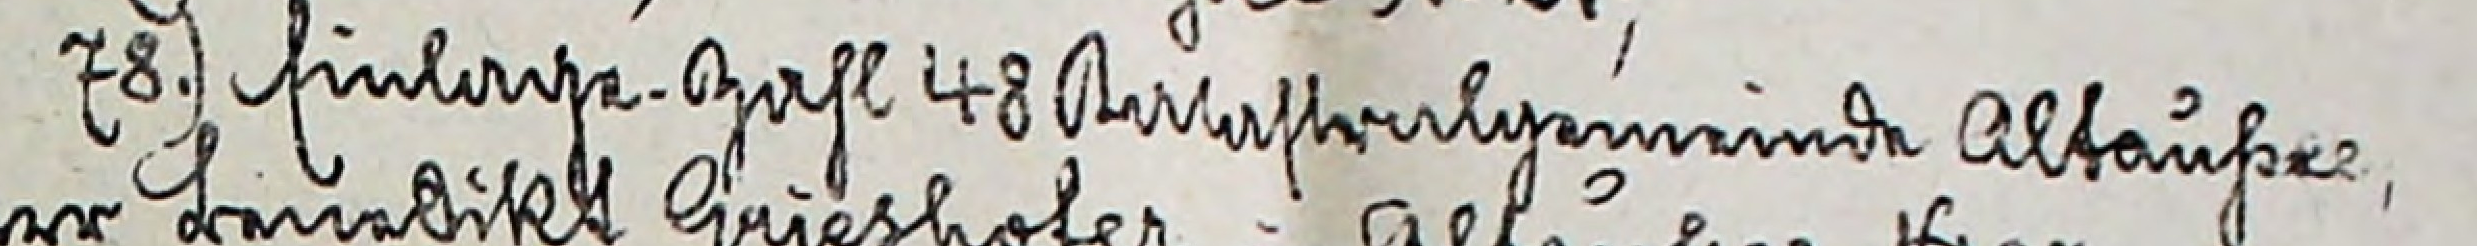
78.) Einlage - Zahl 48 Katastralgemeinde Altaussee,
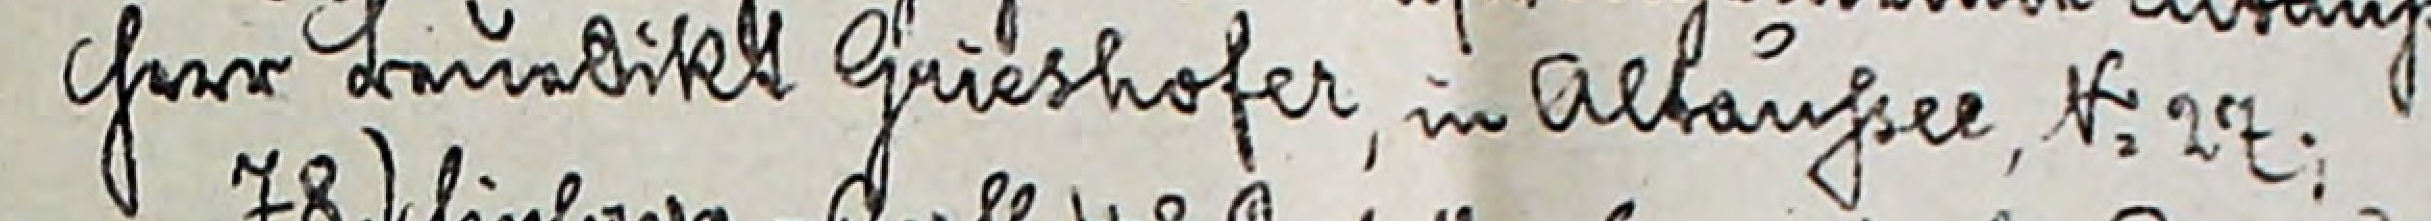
Herr Benedikt Grieshofer, in Altaussee, № 27;
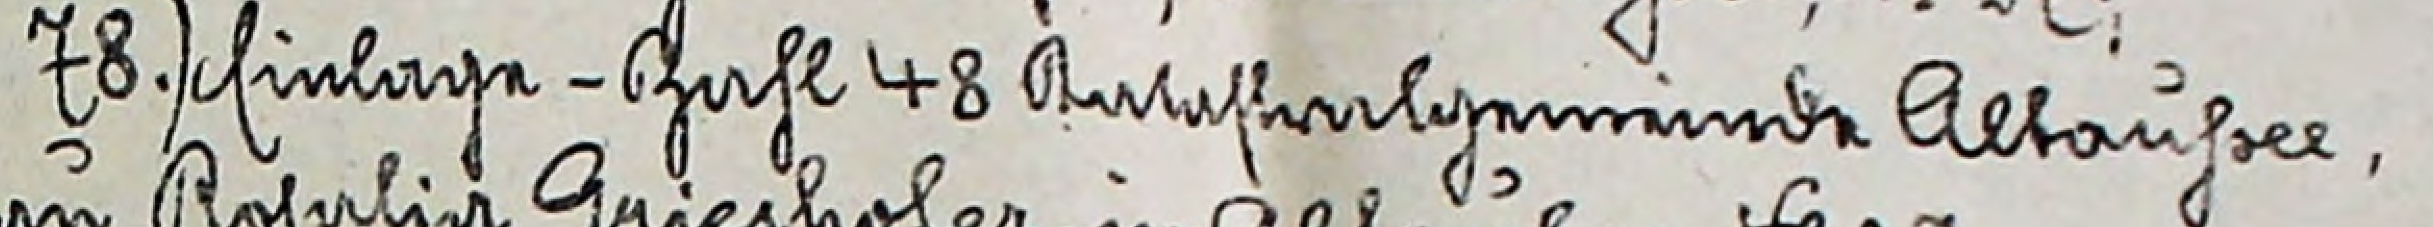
78.) Einlage - Zahl 48 Katastralgemeinde Altaussee,
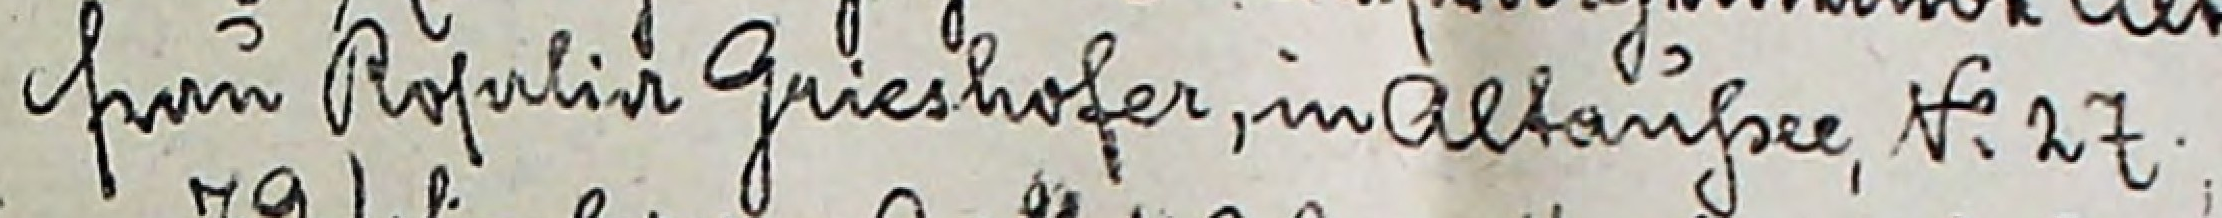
Frau Rosalia Grieshofer, in Altaussee, № 27;
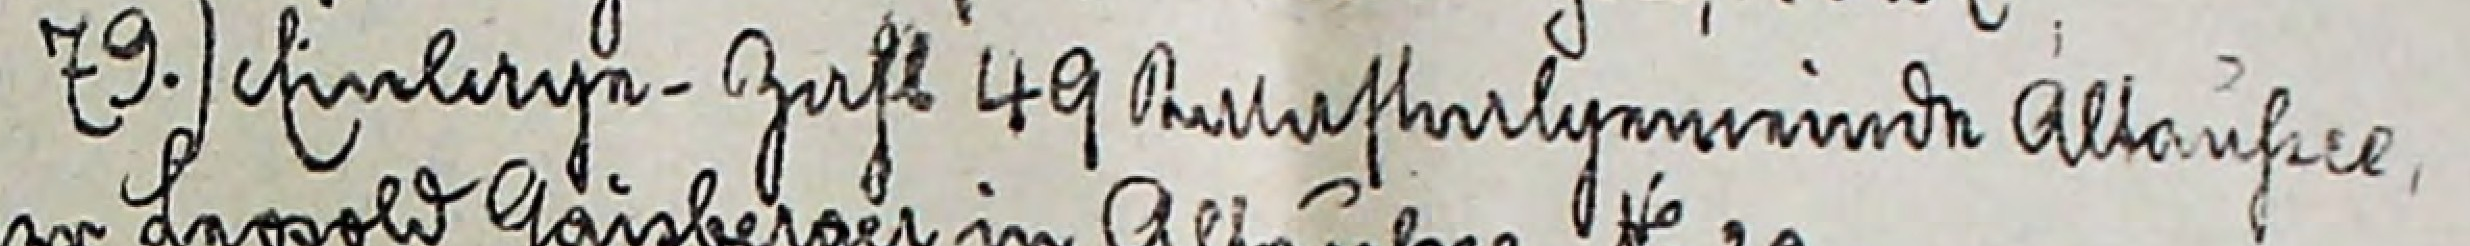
79.) Einlage - Zahl 49 Katastralgemeinde Altaussee,
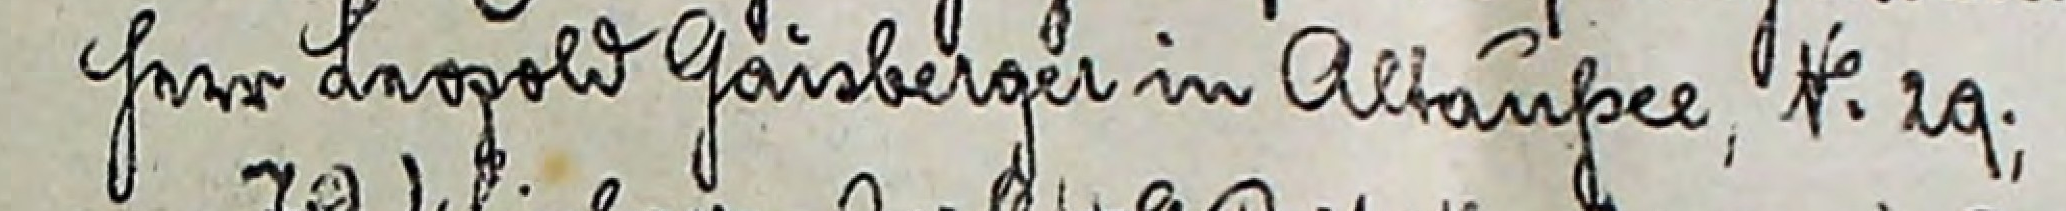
Herr Leopold Gaisberger in Altaussee, № 29;
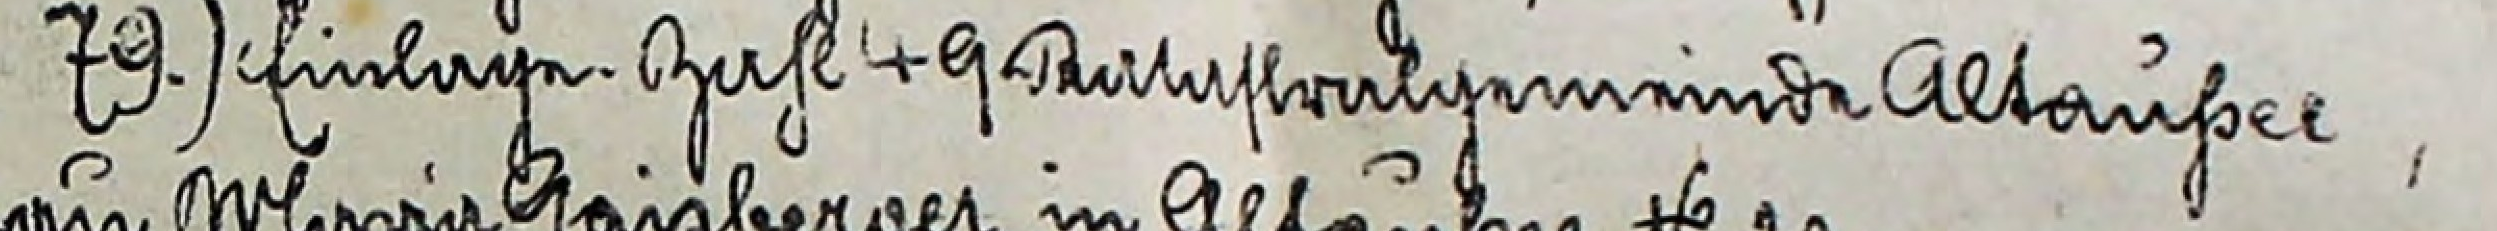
79.) Einlage - Zahl 49 Katastralgemeinde Altaussee,
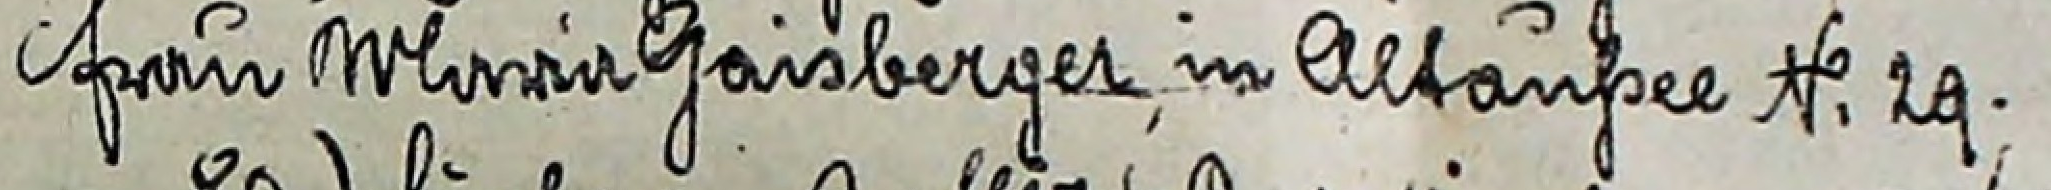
Frau Maria Gaisberger, in Altaussee № 29;
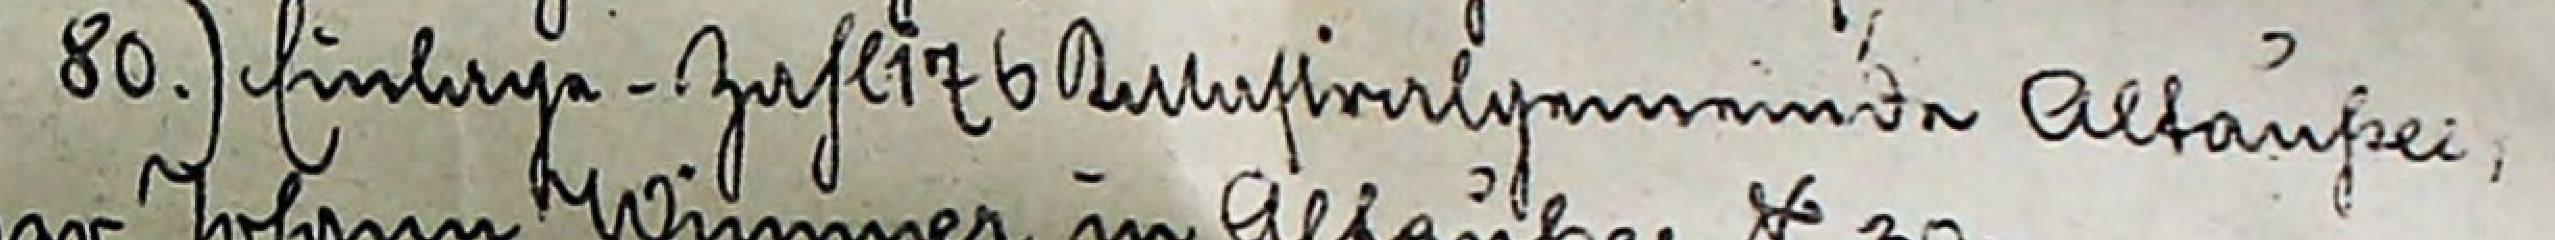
80.) Einlage - Zahl 176 Katastralgemeinde Altaussee,
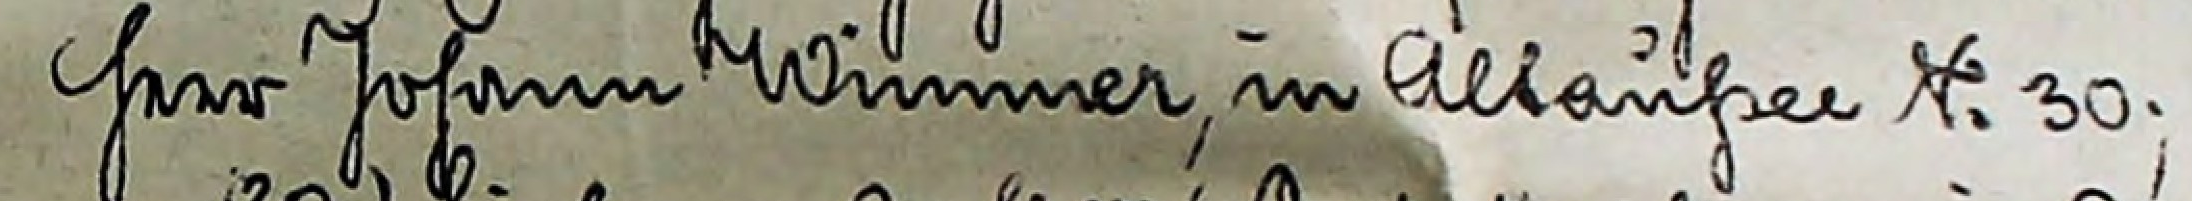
Herr Johann Wimmer, in Altaussee № 30;
